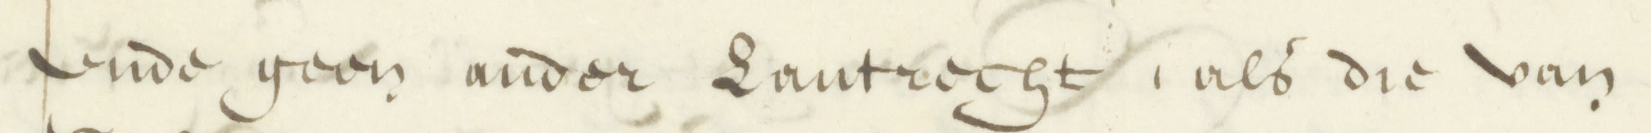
eende geen ander Lantrecht, als die van
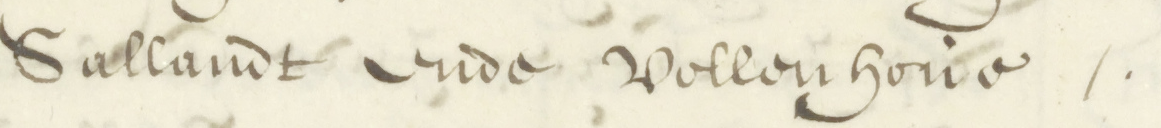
Sallandt ende Vollenhove.
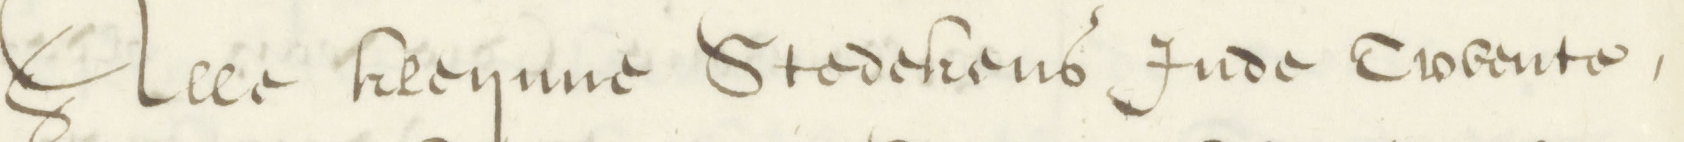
Alle kleynne Stedekens Inde Twente,
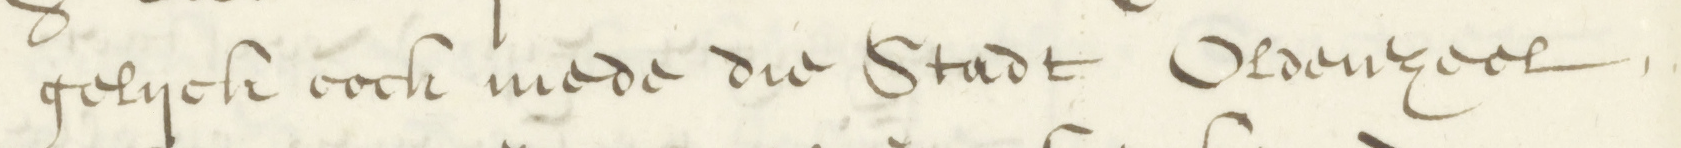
gelyck oock mede die Stadt Oldenzeel,
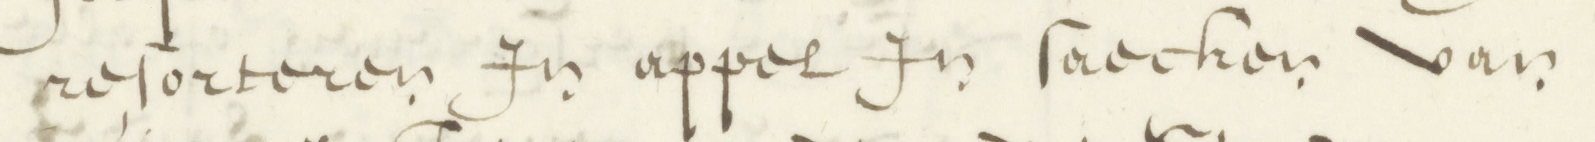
resorteren In appel In saecken van
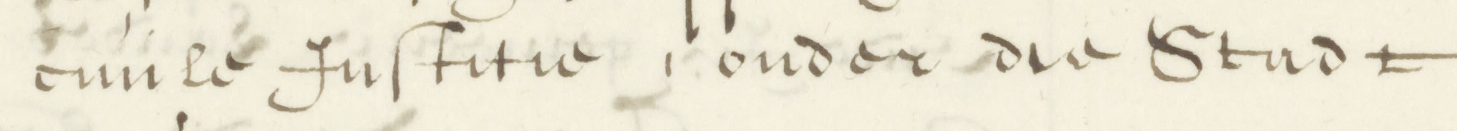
ciuile Justitie, onder die Stadt
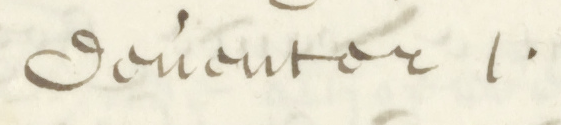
Deuenter.
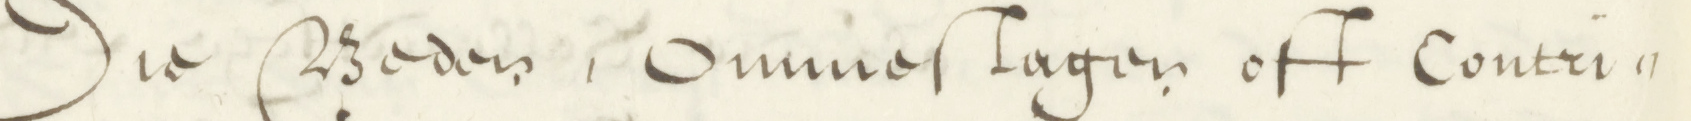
Die Beden, Ommeslagen off Contri„
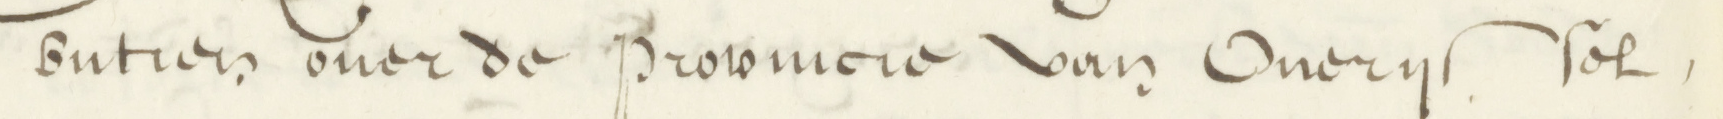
butien ouer de provincie van Oueryssel,
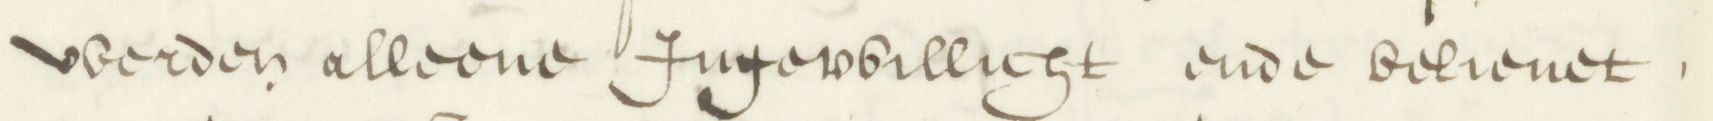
werden alleene Ingewillicht ende belieuet,
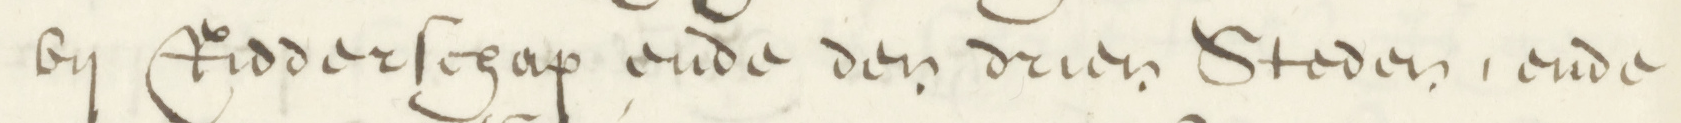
by Ridderschap ende den drien Steden, ende
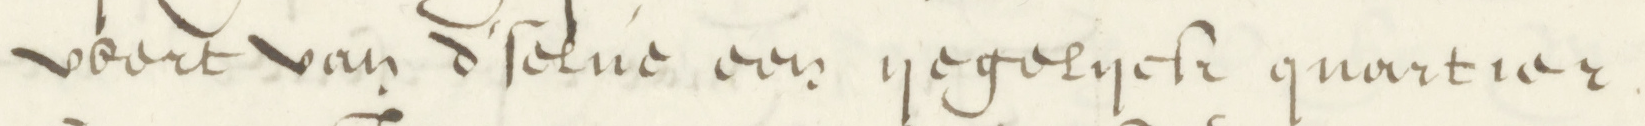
wert van d'selue een yegelyck quartier
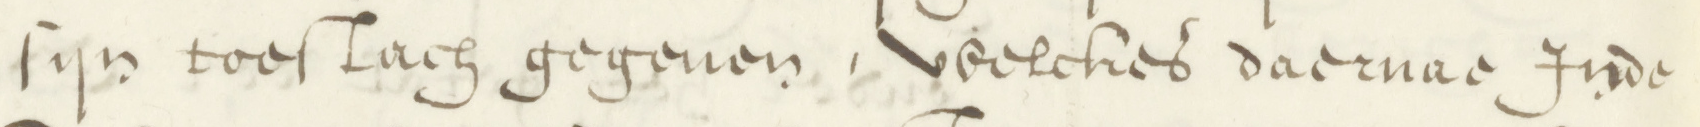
syn toeslach gegeuen, welckes daernae Inde
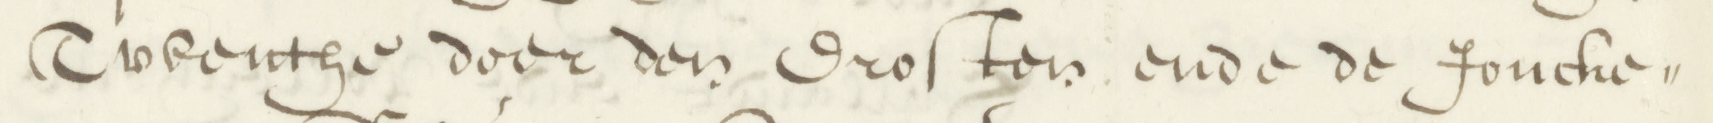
Twenthe doer den Drosten, ende de Joncke„
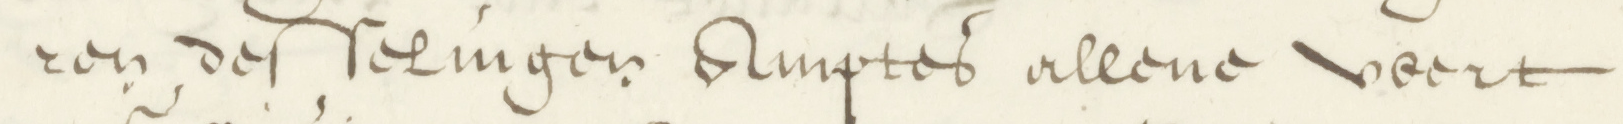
ren desselingen Amptes allene wert
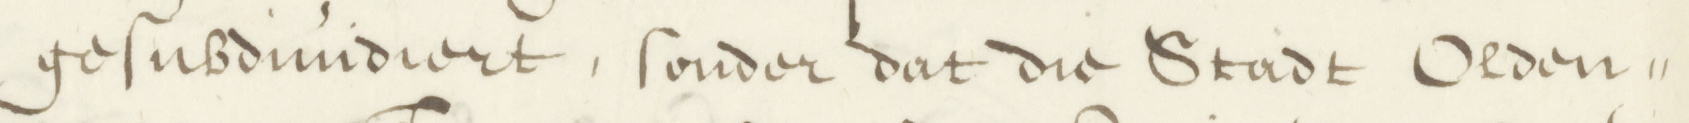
gesubdiuidiert, sonder dat die Stadt Olden„
